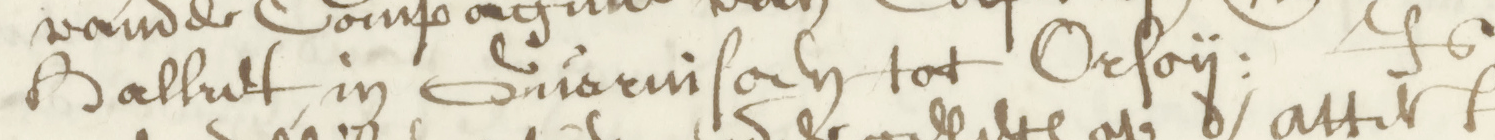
Halket in Guarnisoen tot Orsoij: Is
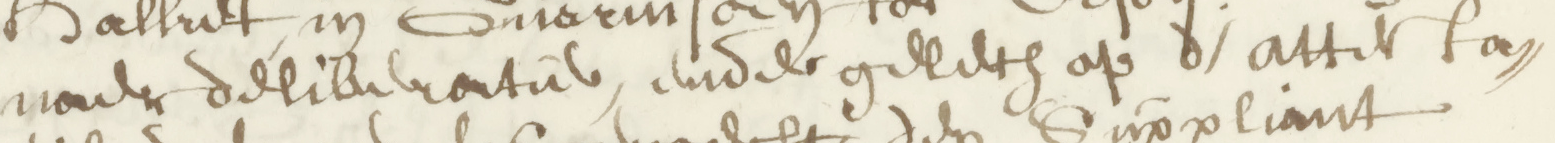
naer deliberatie, ende geleth op d'attesta„
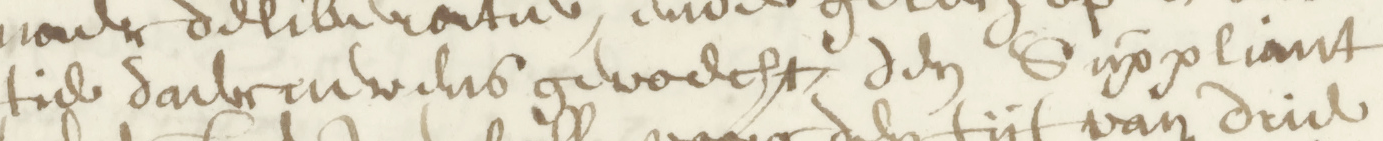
tie daernevens gevoecht, den Suppliant
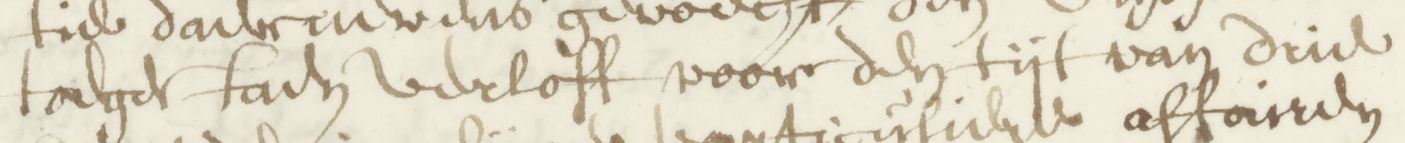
toegestaen verloff voor den tijt van drie
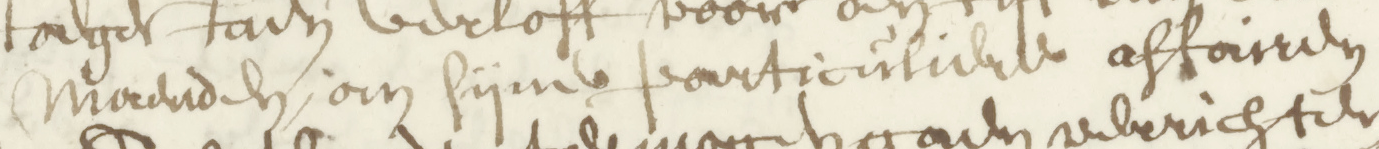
Maenden, om sijne particuliere affairen
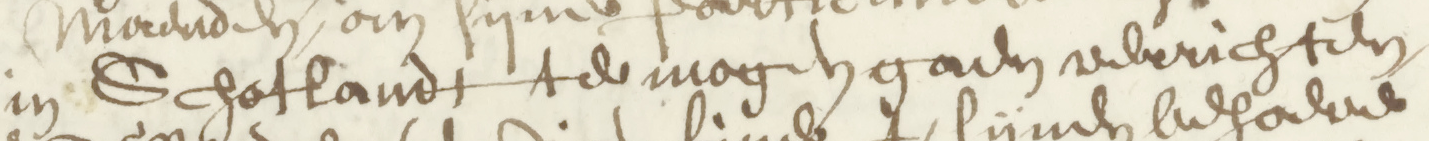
in Schotlandt te mogen gaen verrichten,
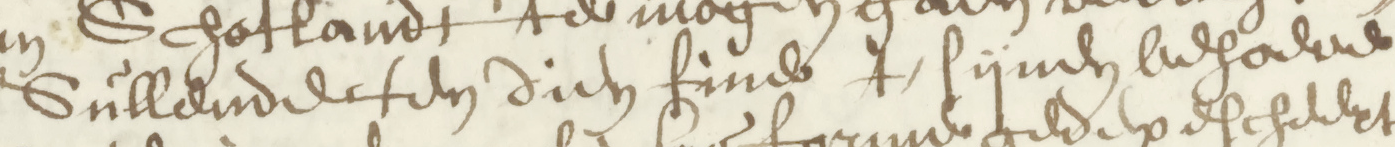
Sullende ten dien fine t‛ sijnen behoeve
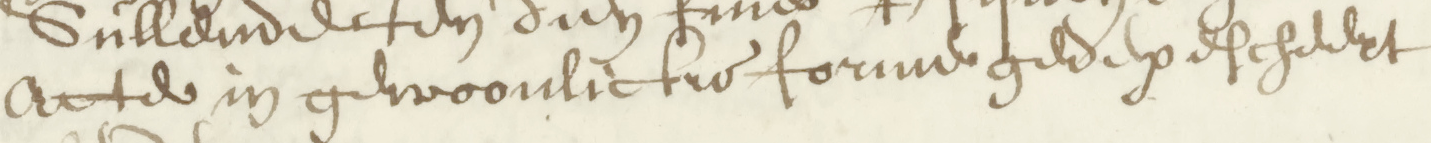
Acte in gewoonlicke forme gedepescheert
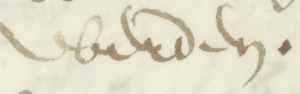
werden.
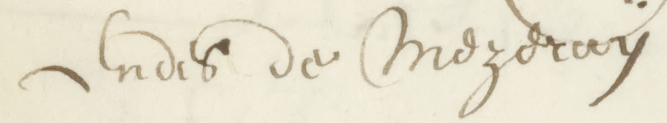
Eudes de Mezeraij
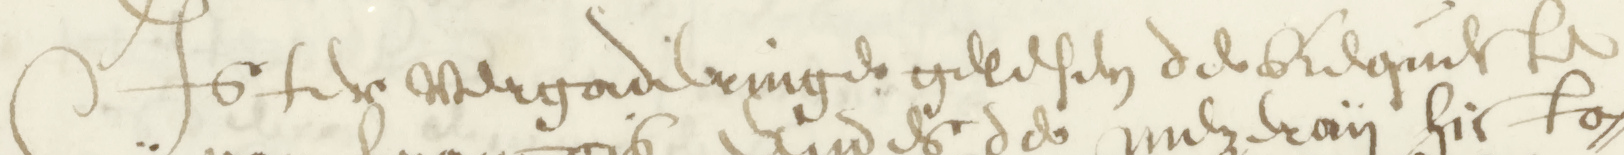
Is ter Vergaderinge gelesen de Requeste
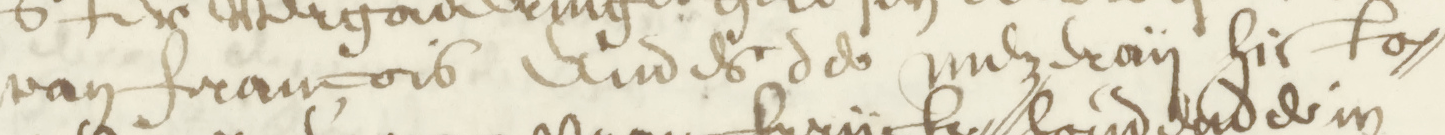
van François Eudes de mezeraij histo„
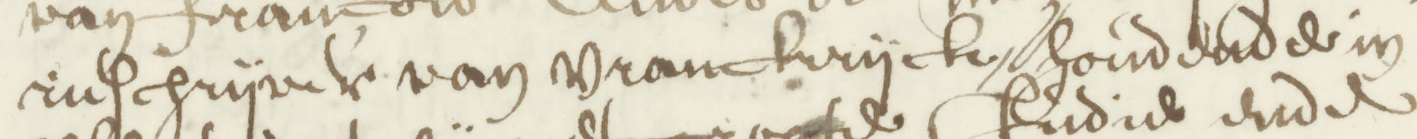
rieschrijver van Vranckrijck, houdende in
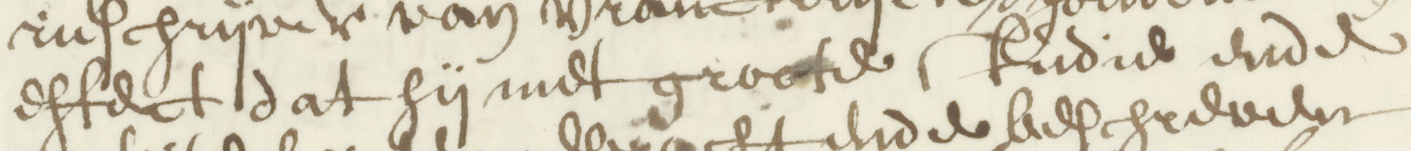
effect dat hij met groote studie ende
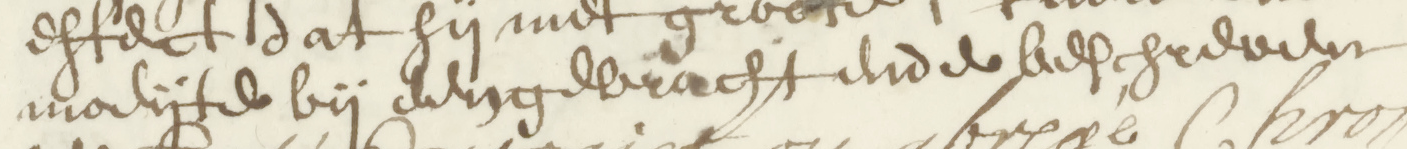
moeijte bij eengebracht ende beschreven
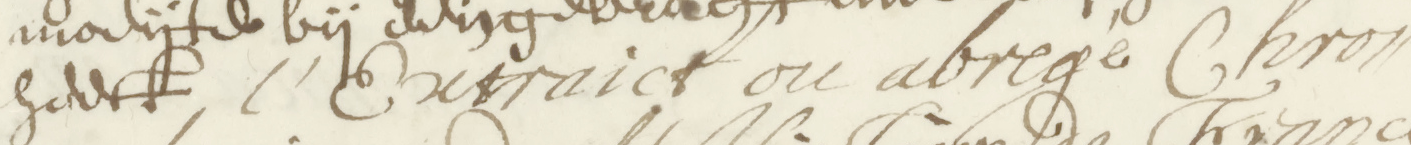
heeft l'Extraict ou abregé Chro„
